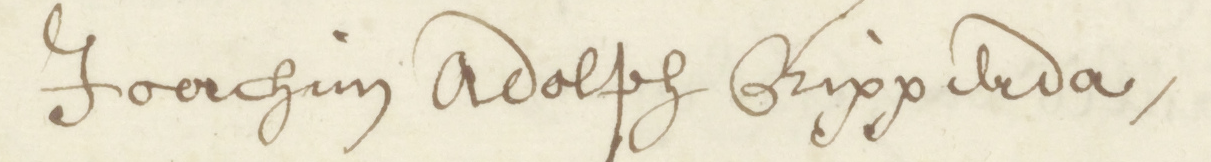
Joachim Adolph Ripperda,
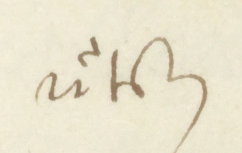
uts
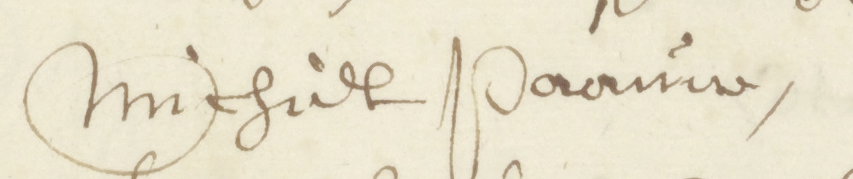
michiel Paauw,
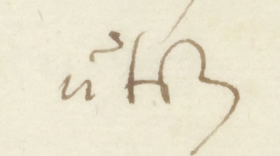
uts
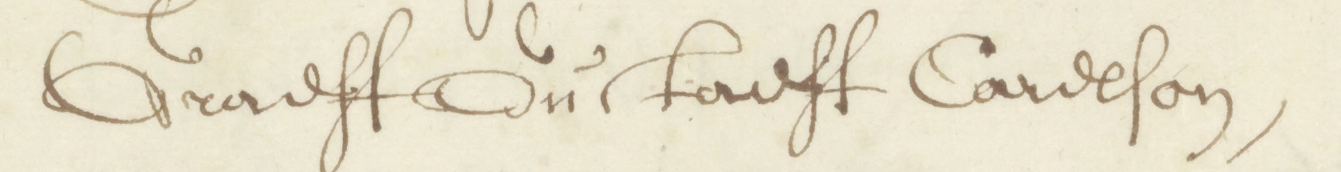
Graeff Gustaeff Carelson,
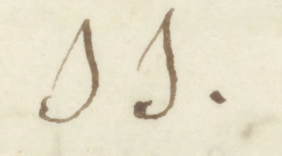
11.
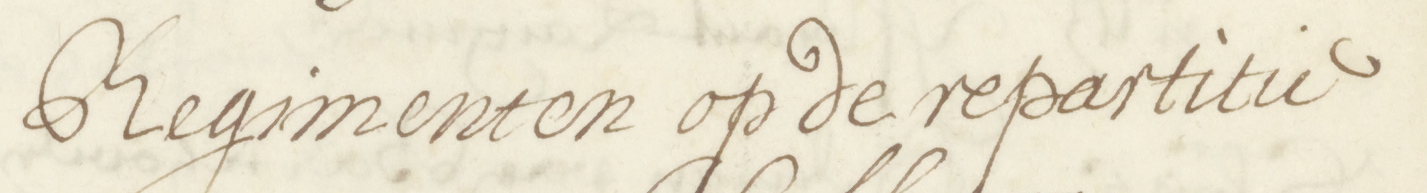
Regimenten op de repartitie
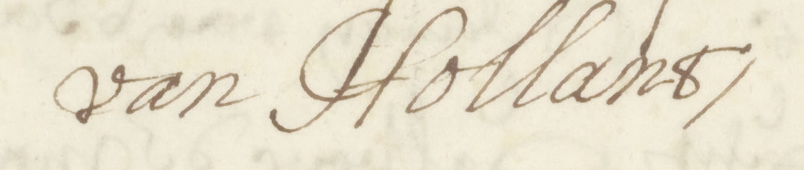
van Hollant
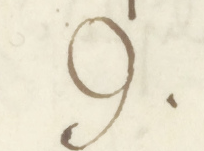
9.
